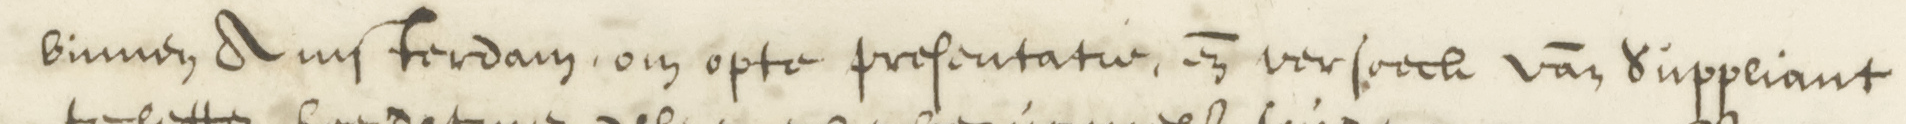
binnen Amsterdam, om opte presentatie, en versoeck van Suppliant
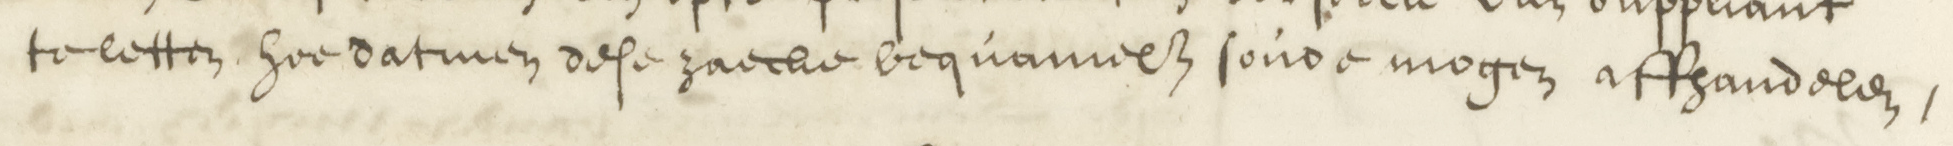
te letten, hoe datmen dese zaecke bequamel soude mogen affhandelen.
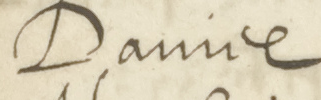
Daniel
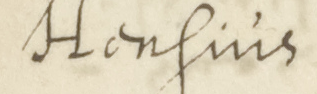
Hensius
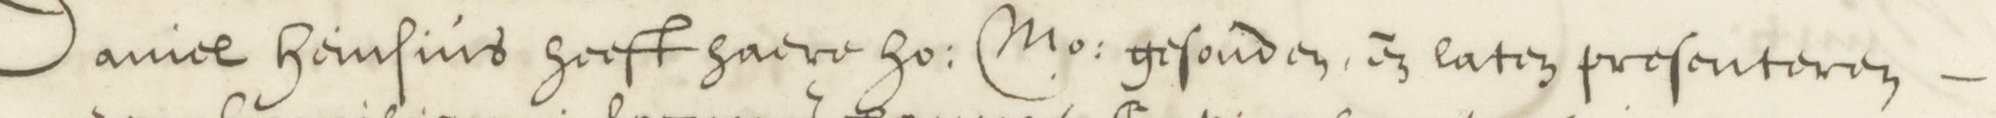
Daniel heinsius heeft haere ho:Mo: gesonden, en laten presenteren -
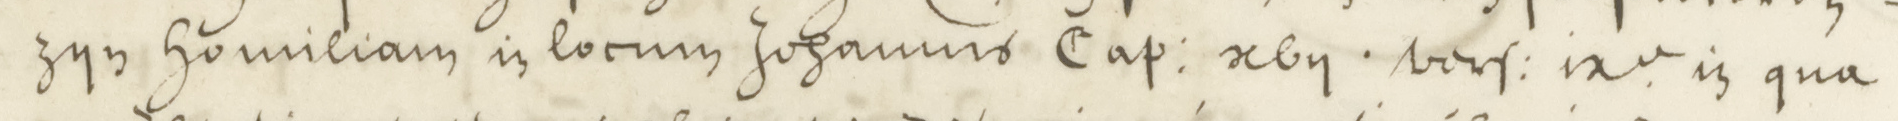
zijn homiliam in locum Johannis Cap: xvij vers: ixe in qua
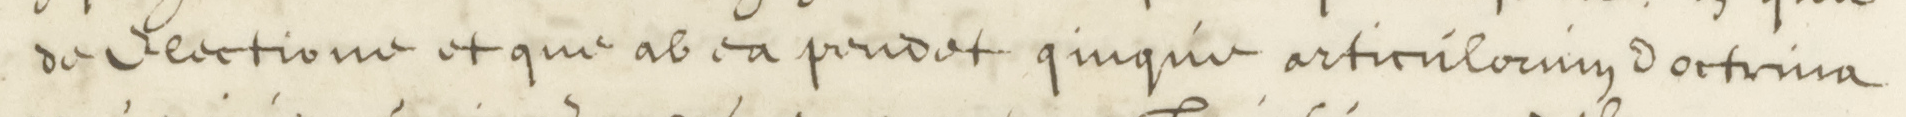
de Electione et que ab ea pendet qinque articulorum doctrina
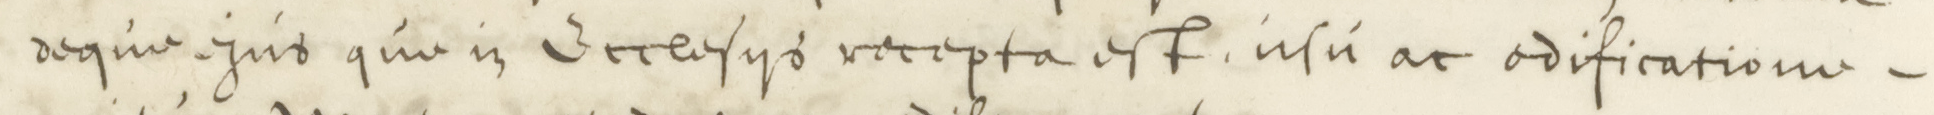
deque ejus que in Ecclesys recepta est usu ac edificatione
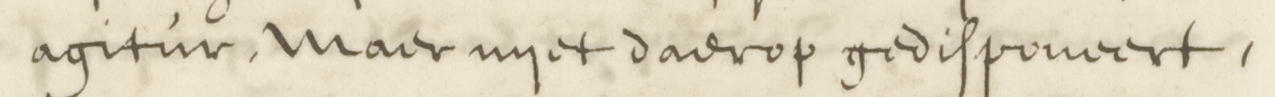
agitur. Maer nyet daerop gedisponeert.
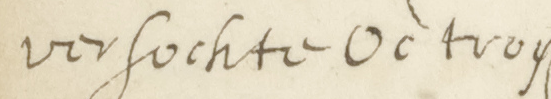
versochte Octroy
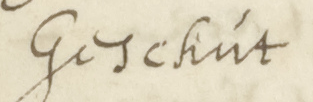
Geschut
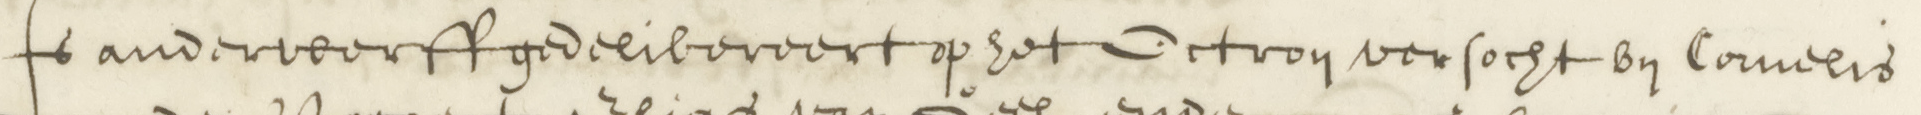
Is anderwerff gedelibereert op het Octroy versocht by Cornelis
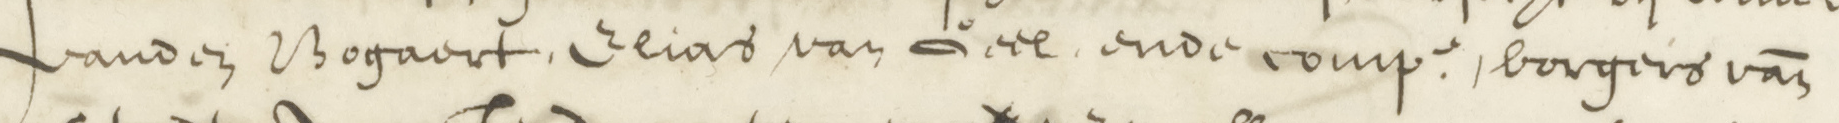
vanden Bogaert, Elias van Geel, ende compe., borgers van
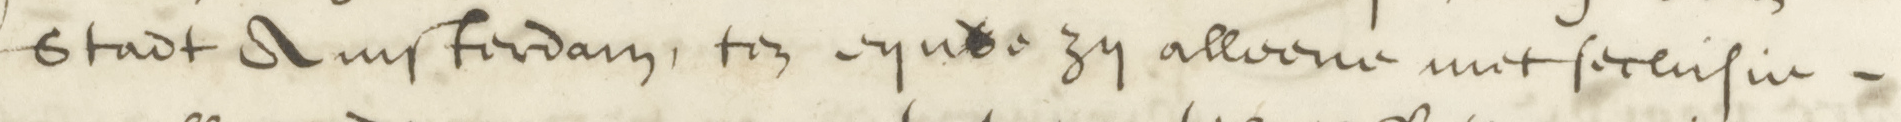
Stadt Amsterdam, ten eynde zy alleene met seclusie
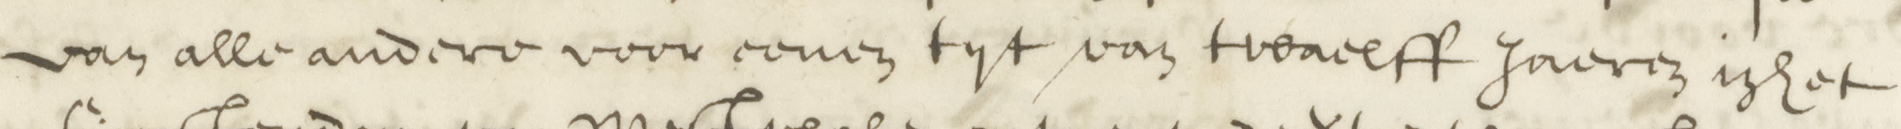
van alle andere voor eenen tyt van twaelff Jaeren in het
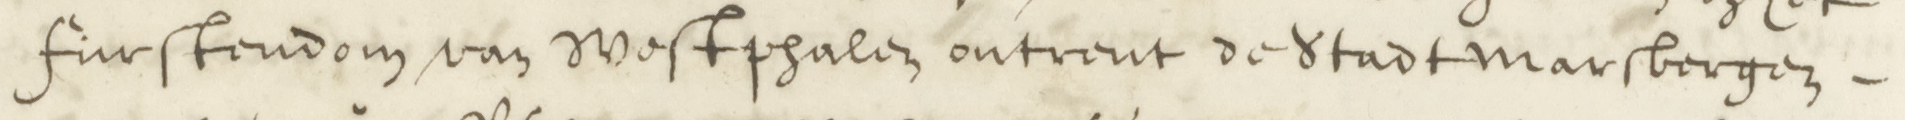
furstendom van Westphalen ontrent de Stadt marsbergen -
